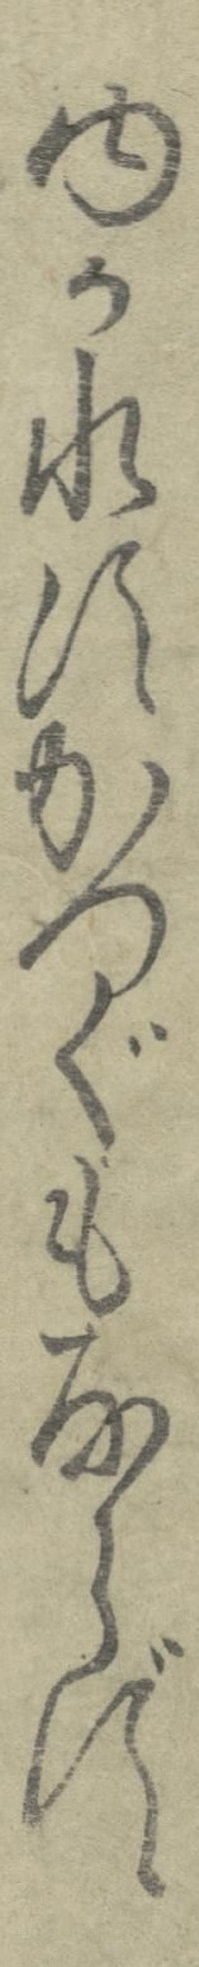ゆかれすかつぐもならず
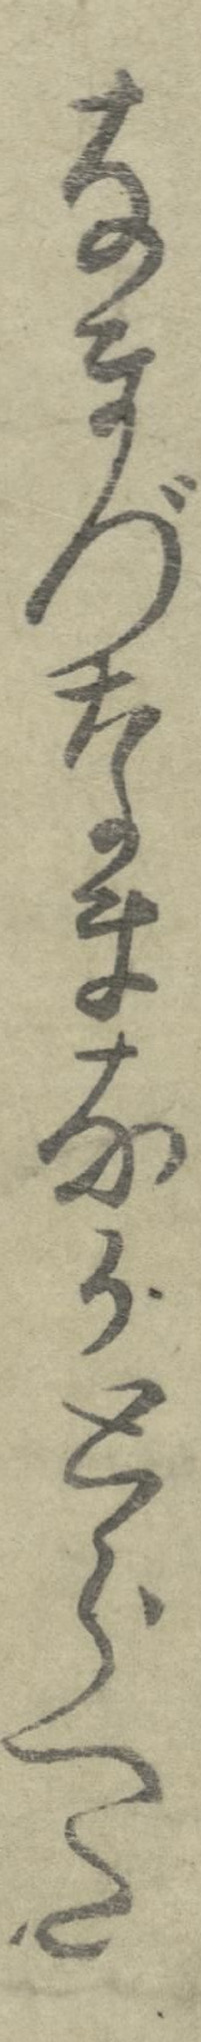なまづなまなかとらへた
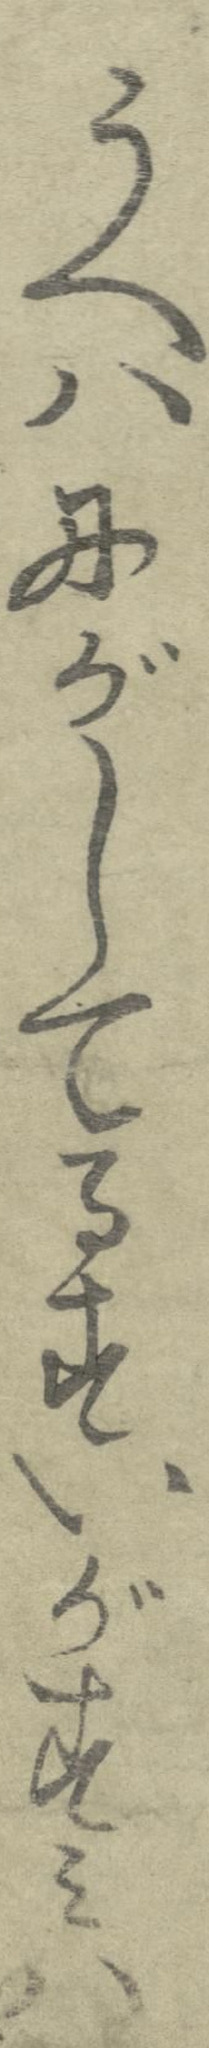うへはにがしてるすいがすみは
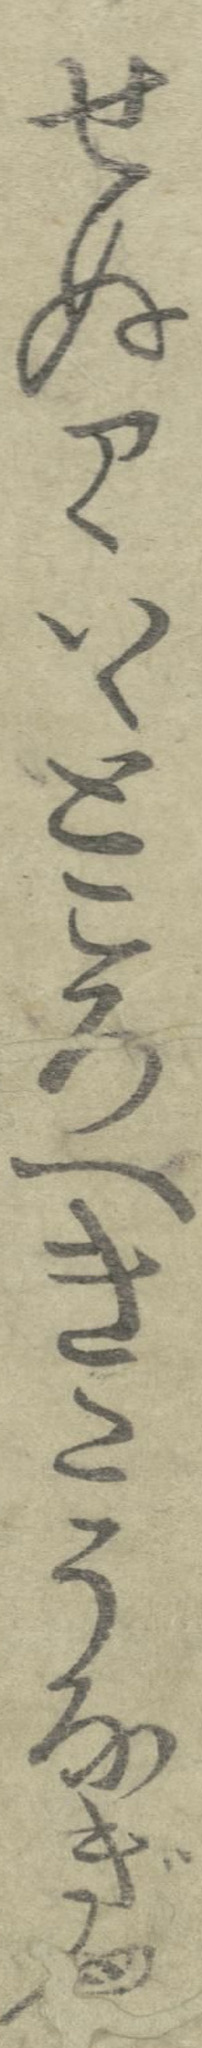せぬアヽいゝところへきたうなぎや
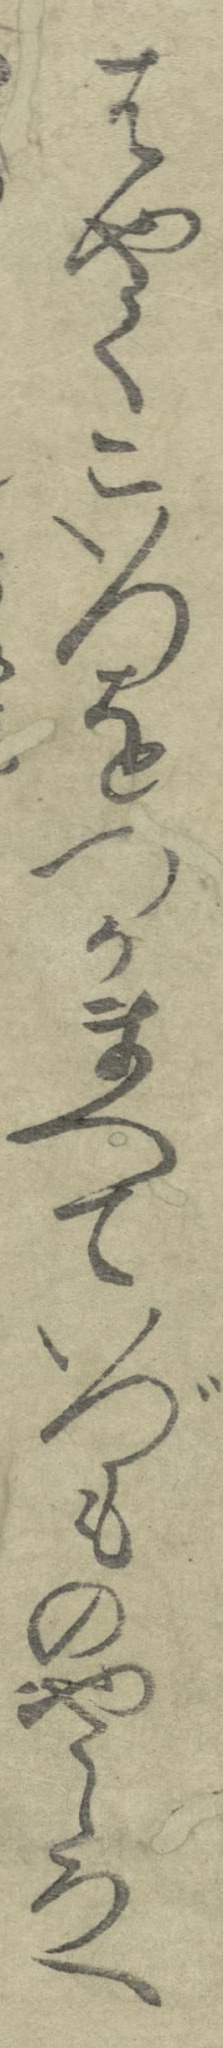はやくこいつをつかまへていづものやしろへ
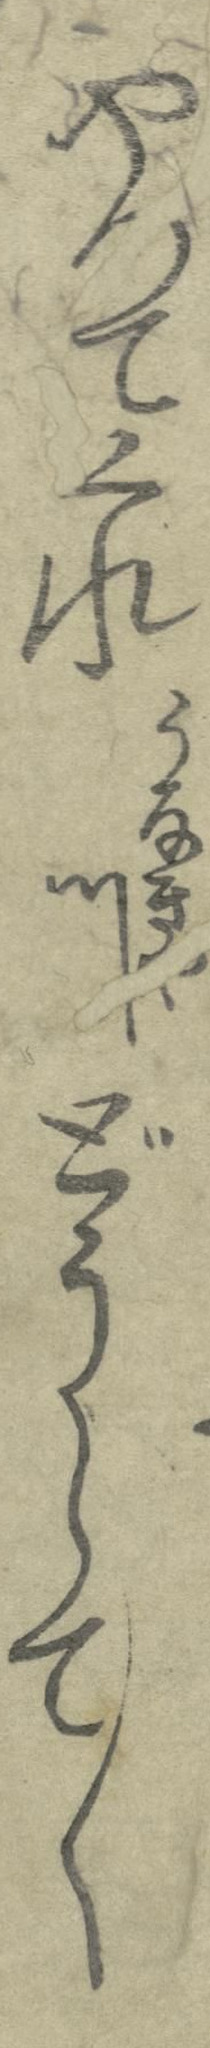やつてくれうなきや〽どうして〳〵
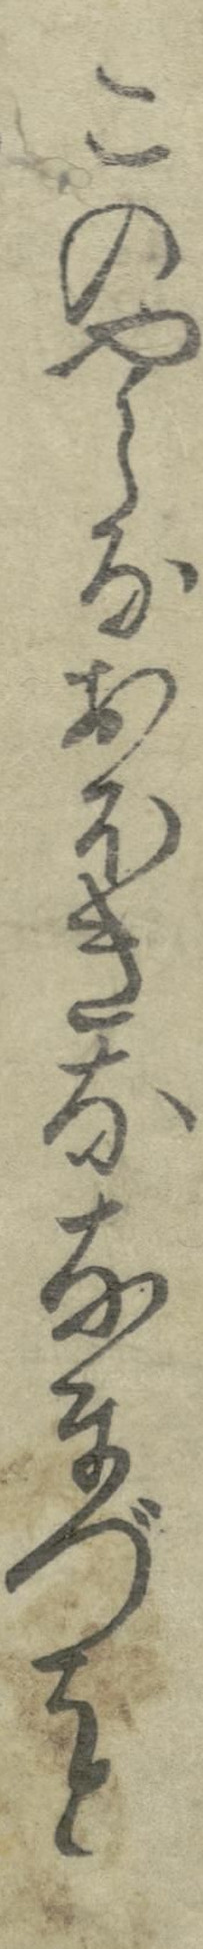このやうなおほきななまづを
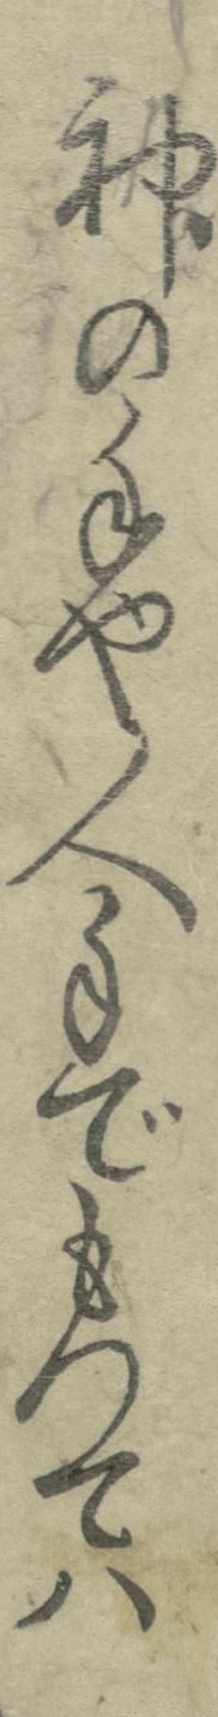神の手や人手でもつては
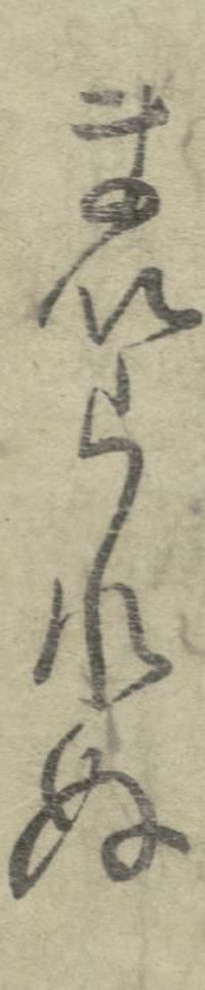まいられぬ
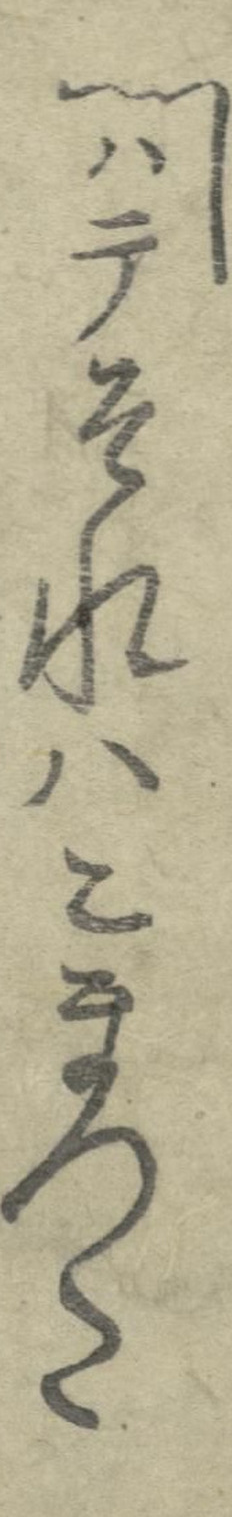〽ハテそれはこまつた
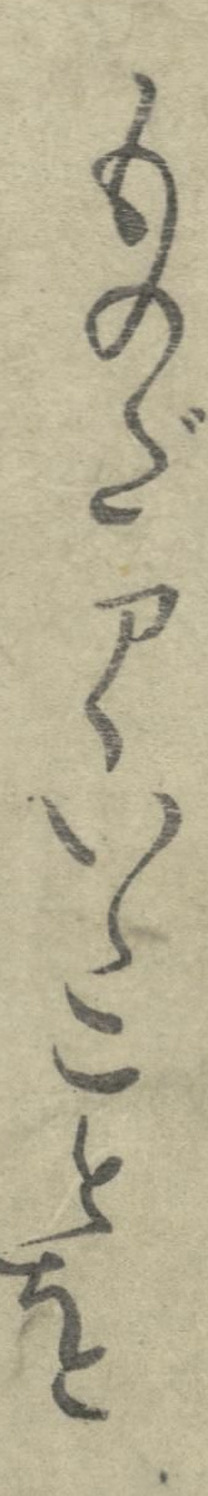ものだアヽいゝことを
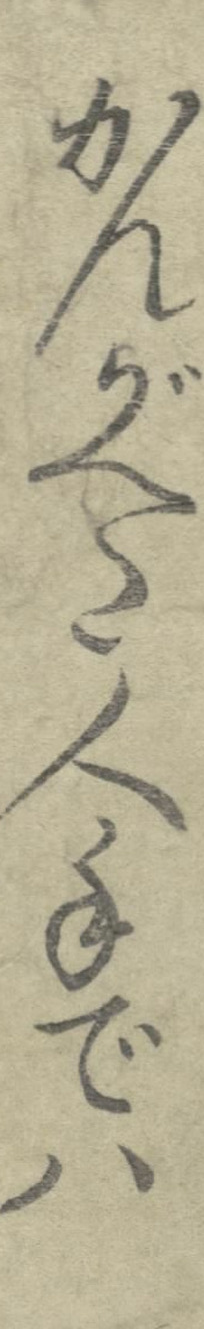かんがへた人手では
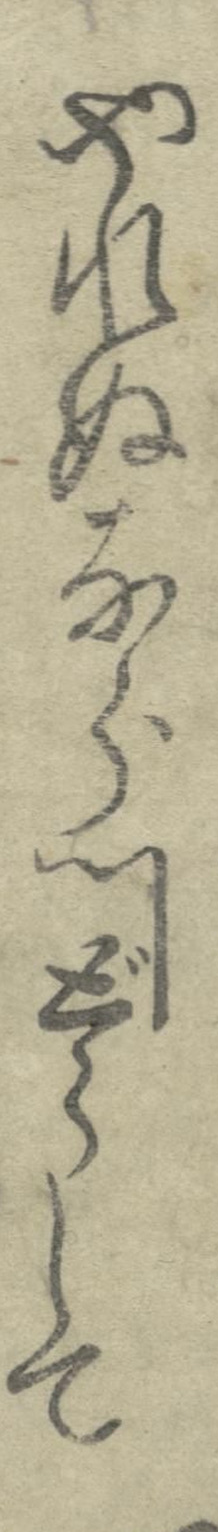やれぬなら〽どうして
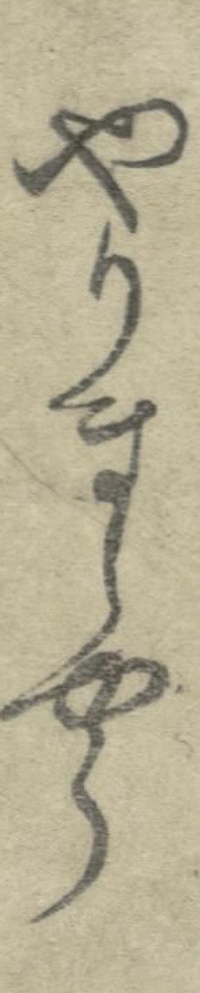やりましやう
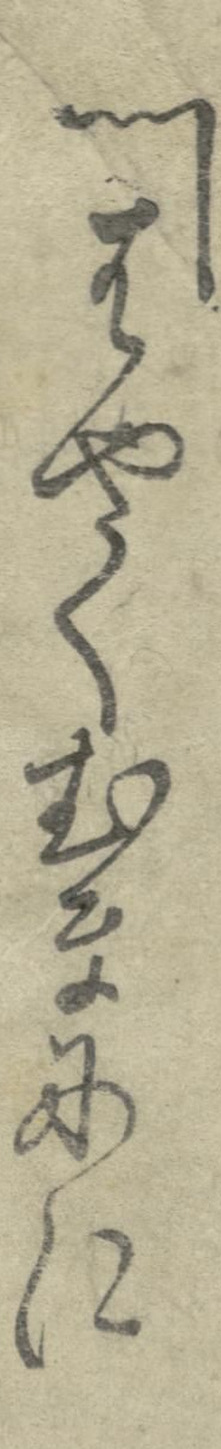〽はやくむまにに
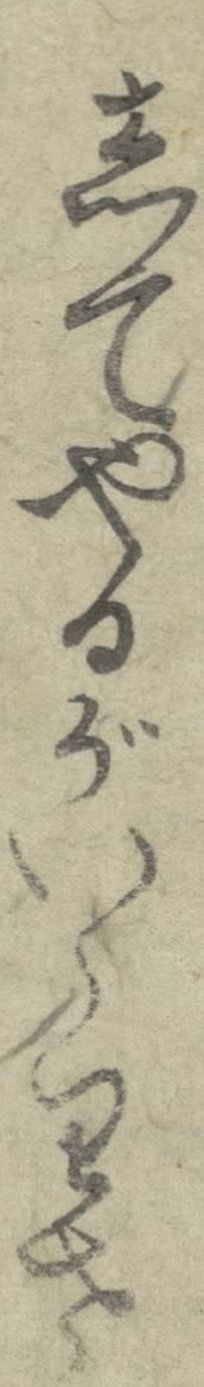してやるがいゝわさ
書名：[鯰をおさえる恵比寿]
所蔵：東京大学地震研究所図書室 Earthquake Research Institute Library, The University of Tokyo, JAPAN
